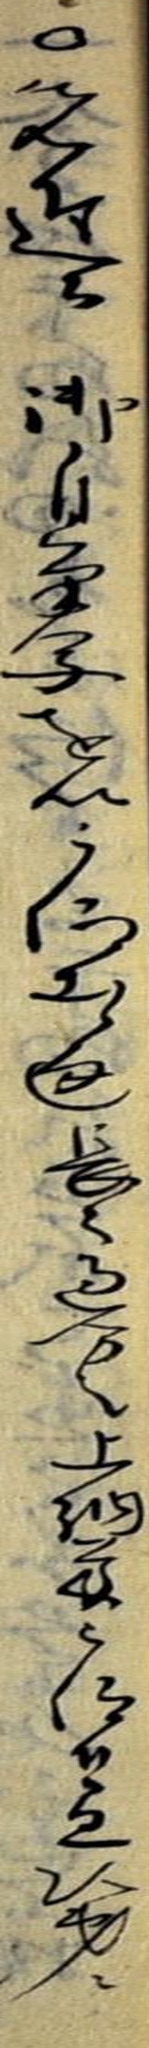〇先達而御自筆写を以被仰出候通長々過分之上納米被仰付置次第ニ
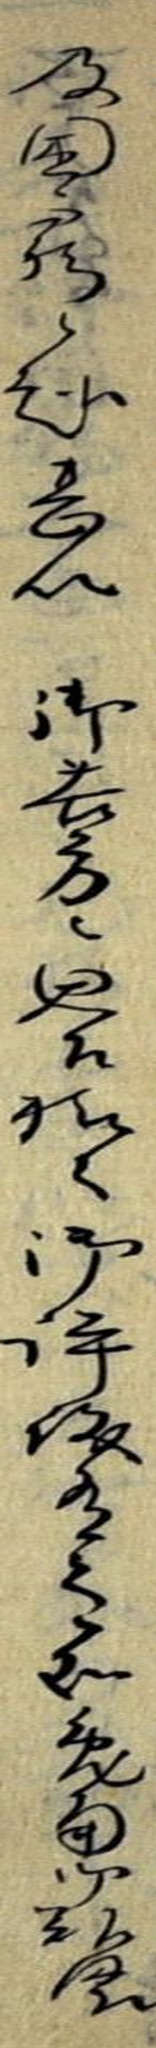及困窮候趣甚以御苦労被思召様々御評議有之候処兎角御難渋
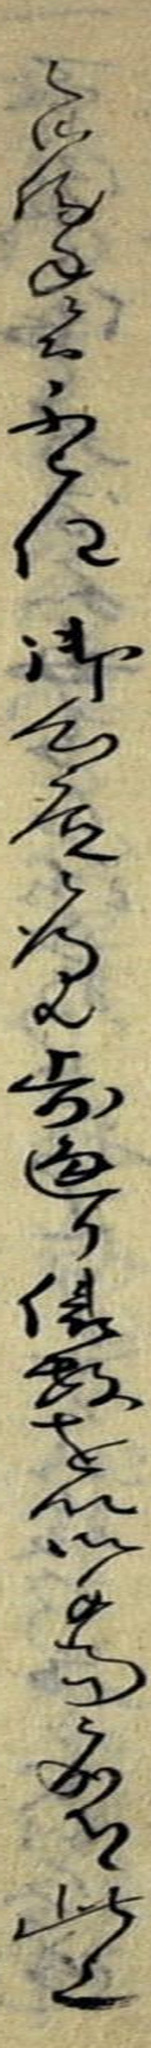之御勝手ニ而不被任御心底候得共歩通り俵数を以御手当ニ成下候此上
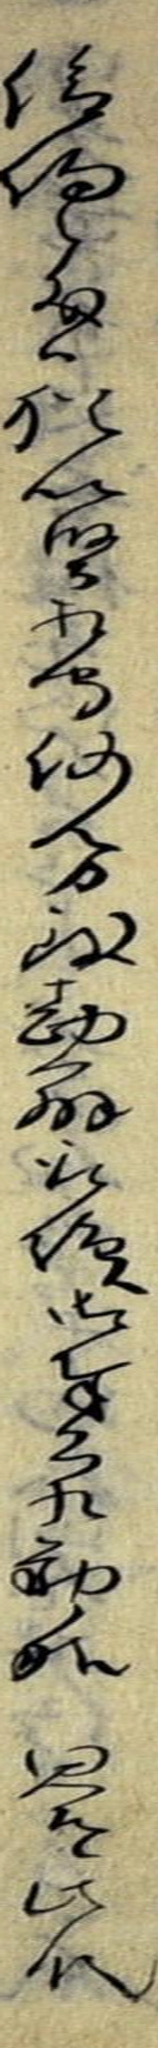倹約之義ハ猶以堅相守何分致勘弁取続御奉公相勤候様思召候此段
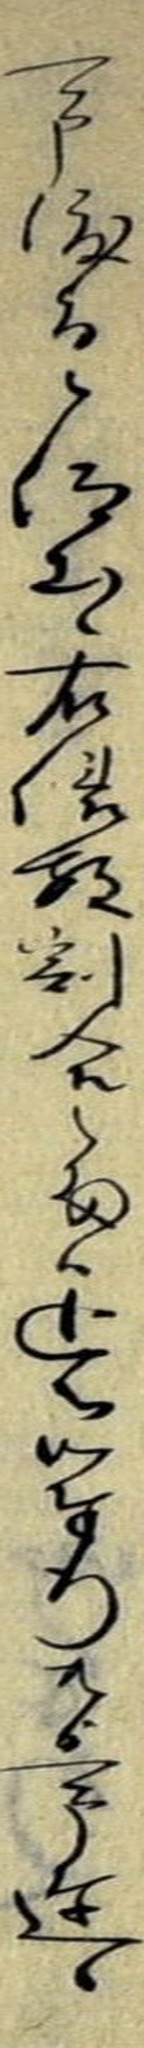可申渡旨被仰出候右俵数割合之義ハ追而御奉行共ゟ可申達候
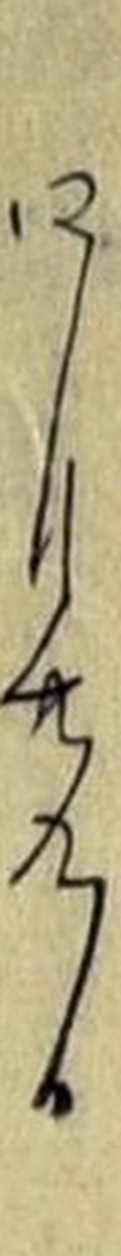四月廿九日
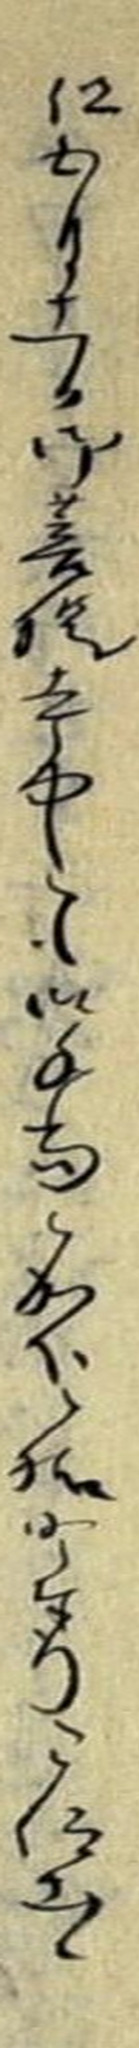但五月十一日御菩提寺中へも御手当被成下候様町奉行へ被仰出候
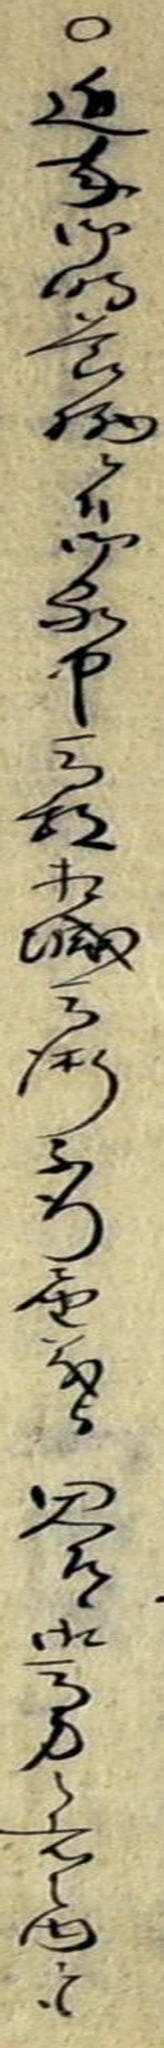〇近年御時節柄ニ付御家中馬数相減馬術不行届義与思召候御馬方之者之内ニも
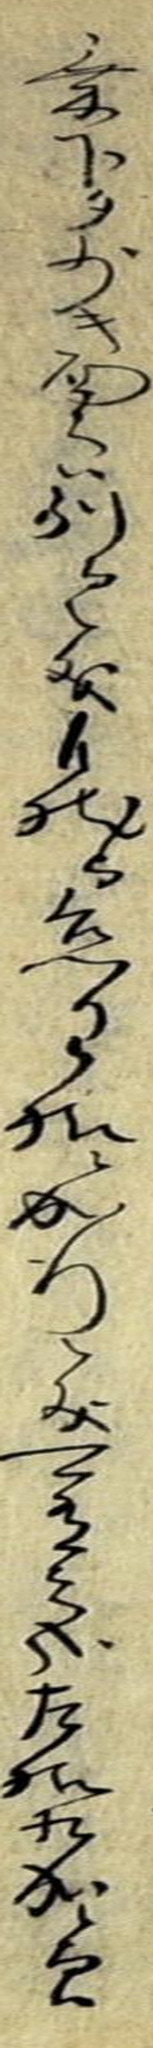乗下タ少キ面々ハ別而之義自然与怠り候様ニ成行候義可有之哉左様相成候而ハ
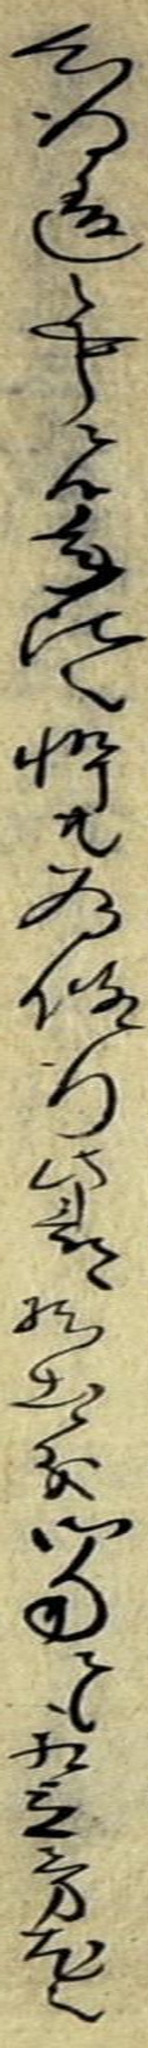心得違之事ニ候年頃之忰共為修行此表へ指出候義御用ニも相立旁尤之
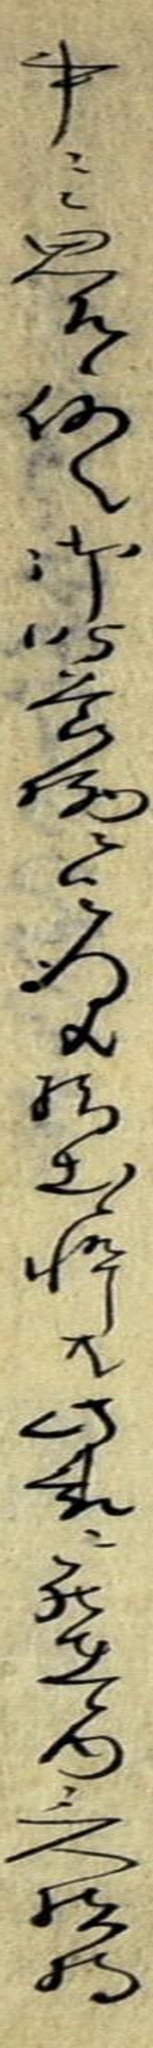事ニ被思召候仍之御時節柄ニハ候得共指出候忰共此表ニ罷在候内三人扶持
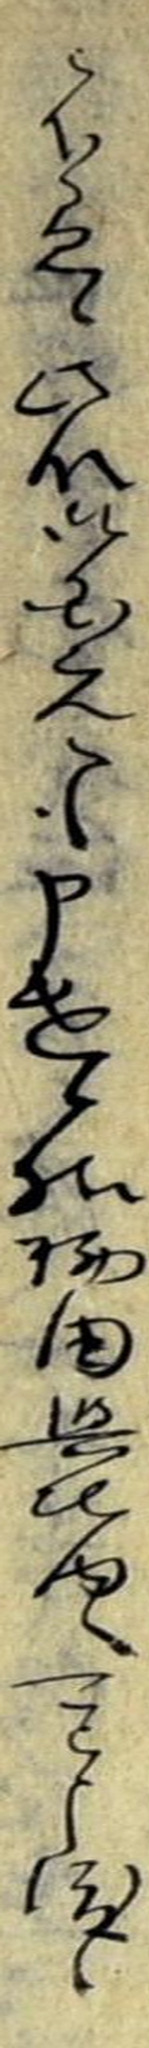被下置候此段御国元へも申遣候様柄田与次内へ可被申渡候

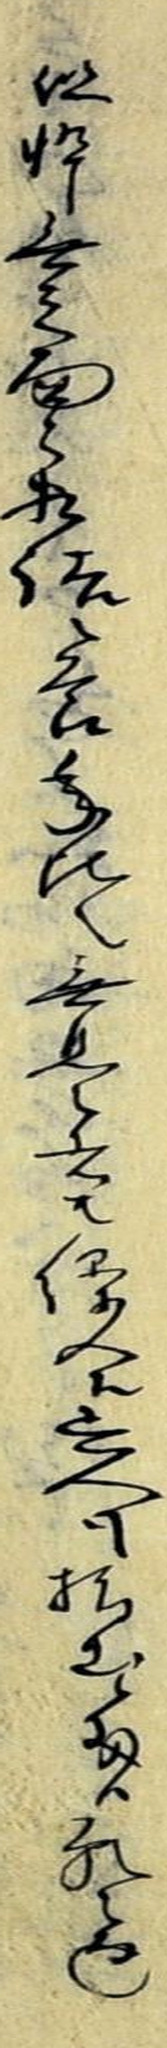但忰無之面々相詰候節年頃之無息之者共繰合壱人ツヽ指出候義ハ願之通
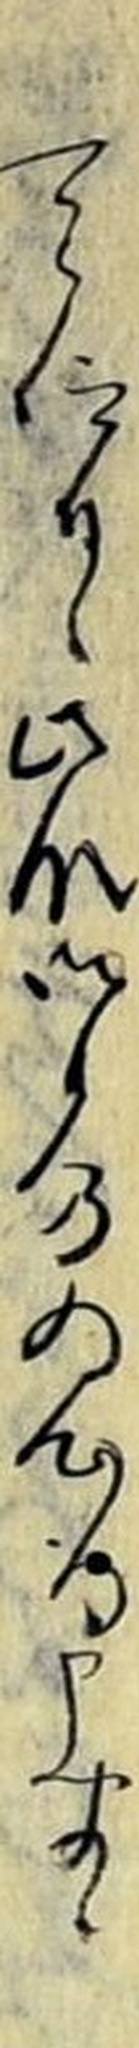可被仰付候此段御自分為心得申聞候
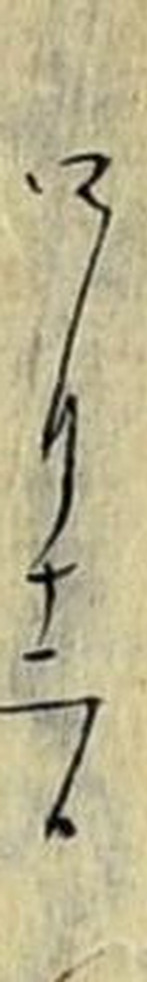四月十二日
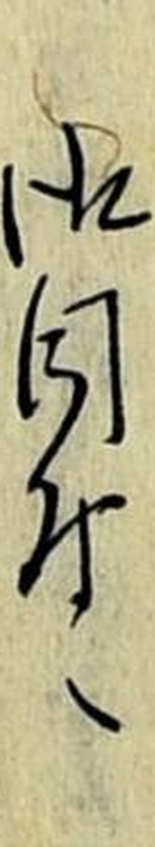御目付へ
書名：命令之部 三
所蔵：福井県文書館 Fukui Prefectural Archives
